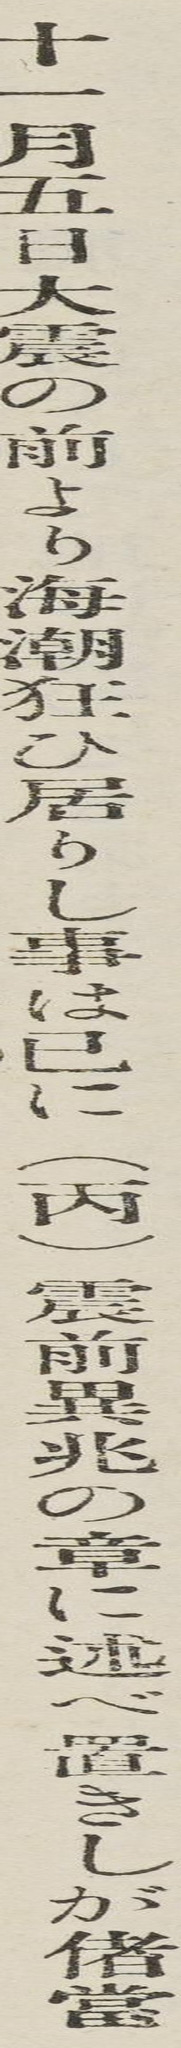十一月五日大震の前より海潮狂ひ居りし事は已に震前異兆の章に述べ置きしが偖当
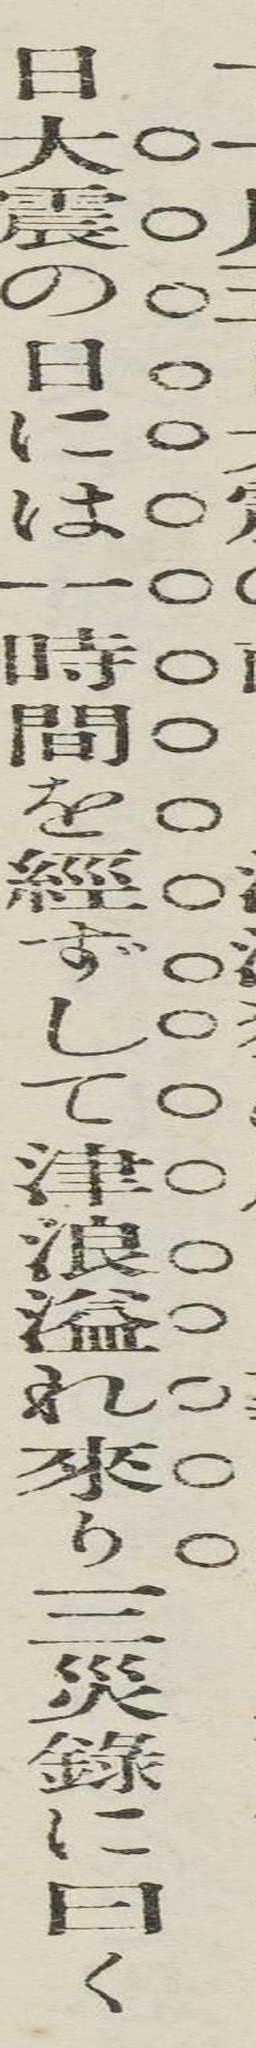日大震の日には一時間を経ずして津浪溢れ来り三災録に曰く
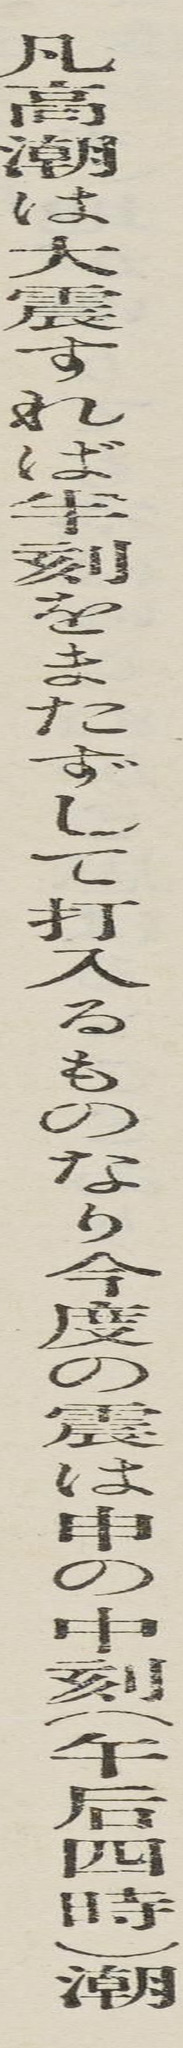凡高潮は大震すれば半刻をまたずして打入るものなり今度の震は申の中刻潮
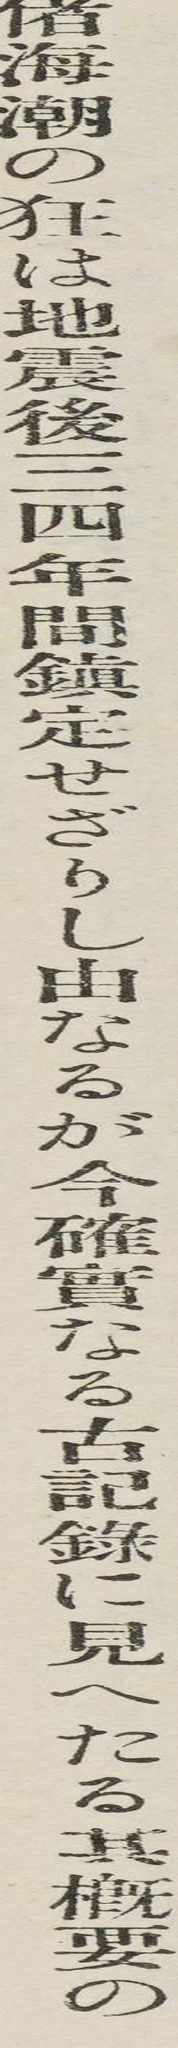偖海潮の狂は地震後三四年間鎮定せざりし由なるが今確実なる古記録に見へたる其概要の
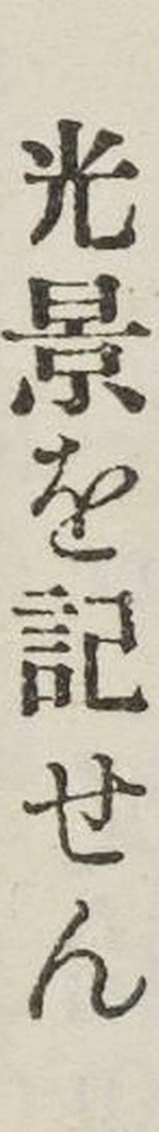光景を記せん
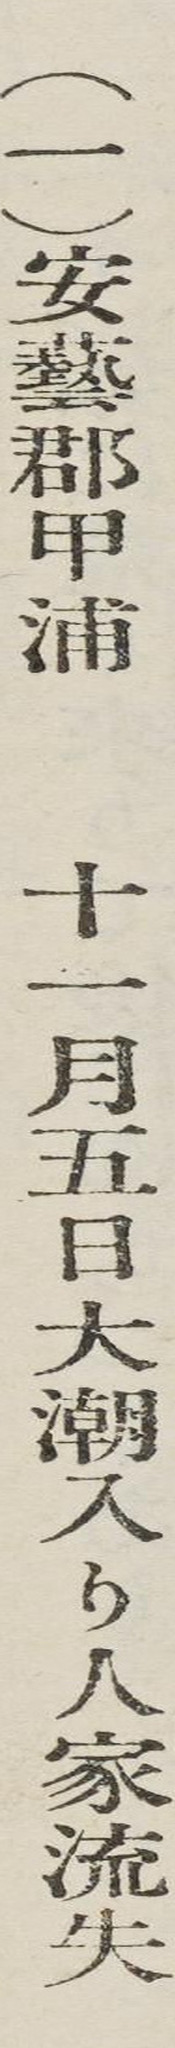㈠安芸郡甲浦十一月五日大潮入り人家流失
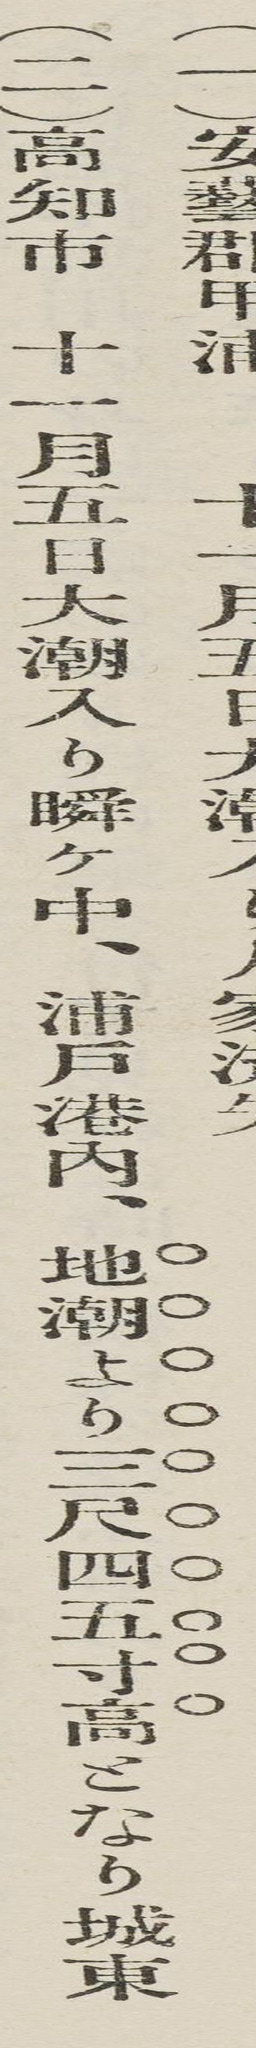㈡高知市十一月五日大潮入り瞬ヶ中、浦戸港内、地潮より三尺四五寸高となり城東
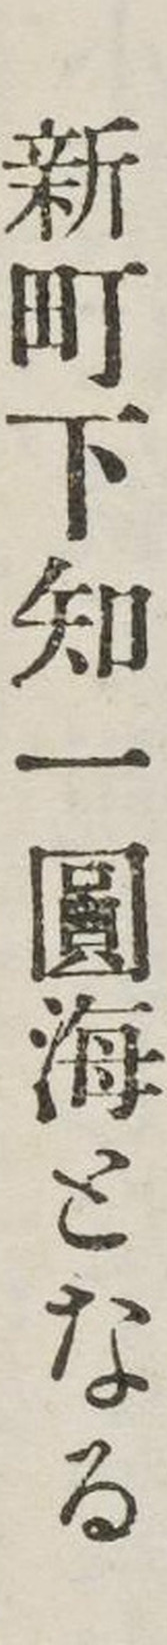新町下知一円海となる
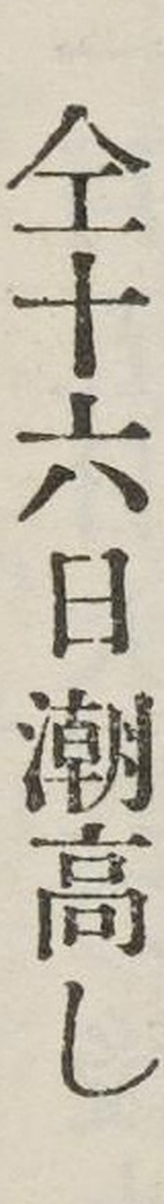仝十六日潮高し
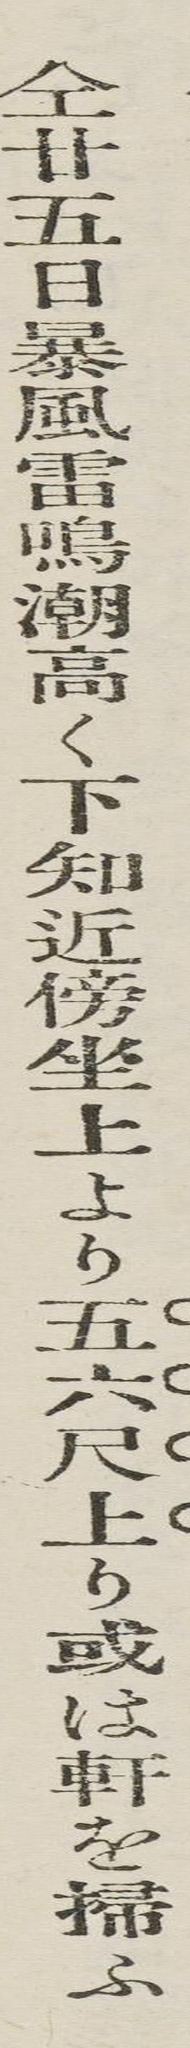仝廿五日暴風雷鳴潮高く下知近傍坐上より五六尺上り或は軒を掃ふ
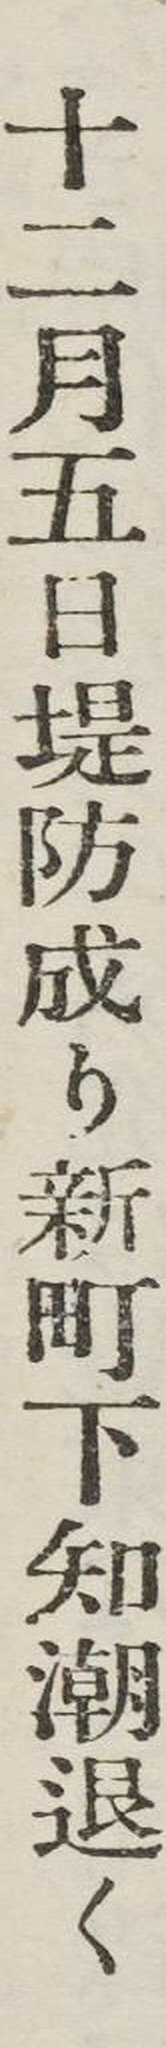十二月五日堤防成り新町下知潮退く
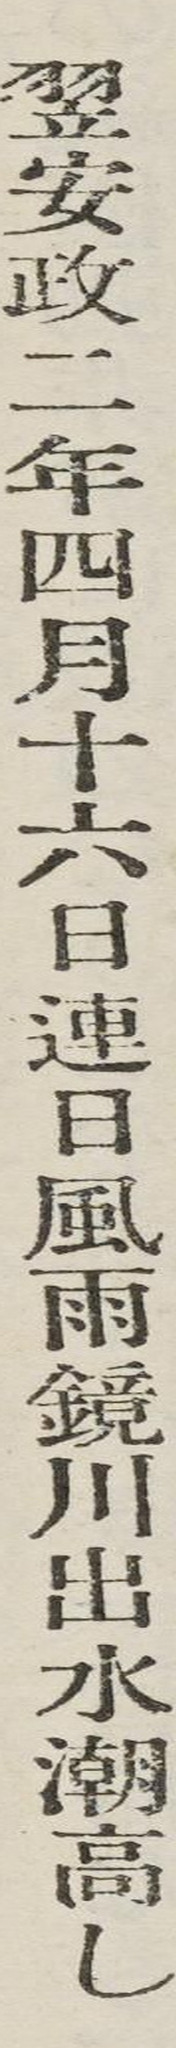翌安政二年四月十六日連日風雨鏡川出水潮高し
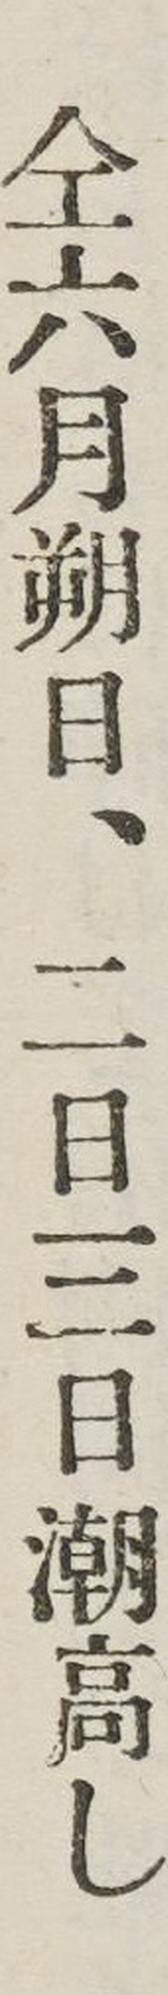仝六月朔日、二日三日潮高し
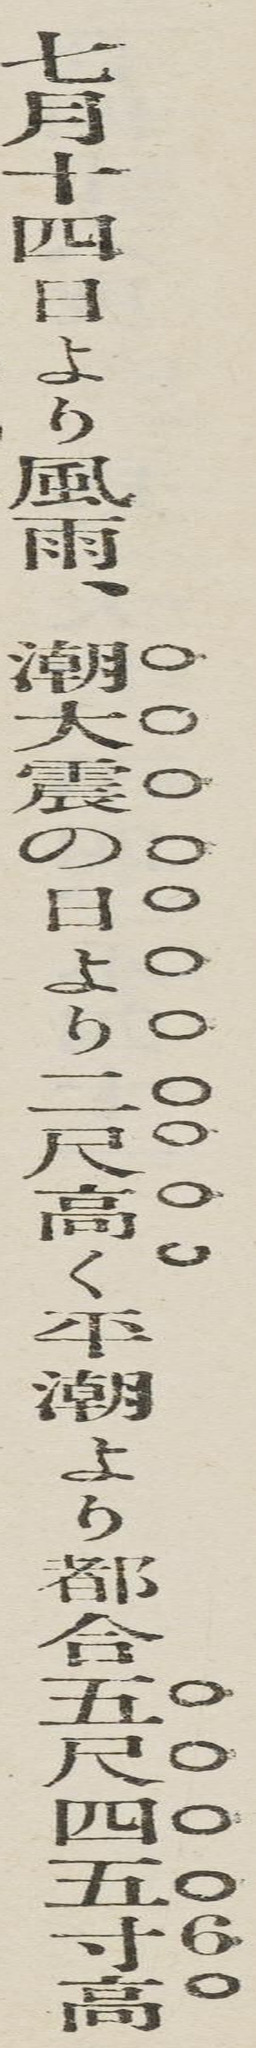七月十四日より風雨、潮大震の日より二尺高く平潮より都合五尺四五寸高
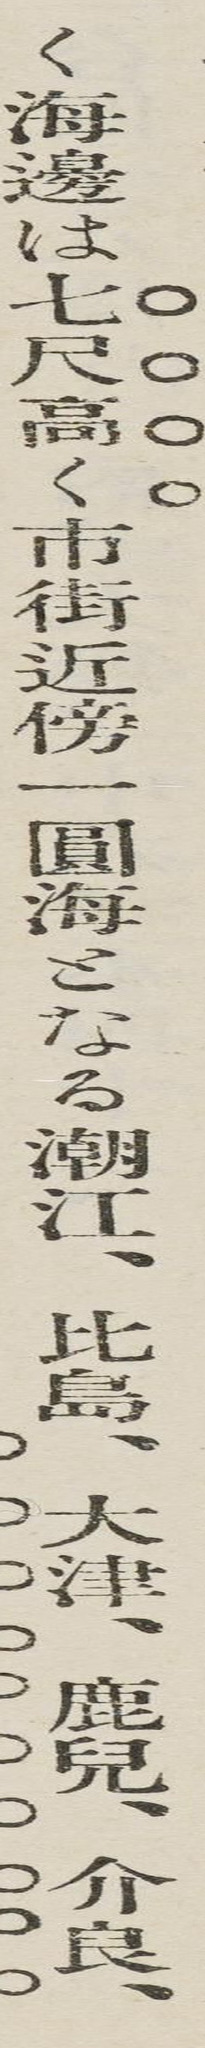く海辺は七尺高く市街近傍一円海となる潮江、比島、大津、鹿兒、介良、
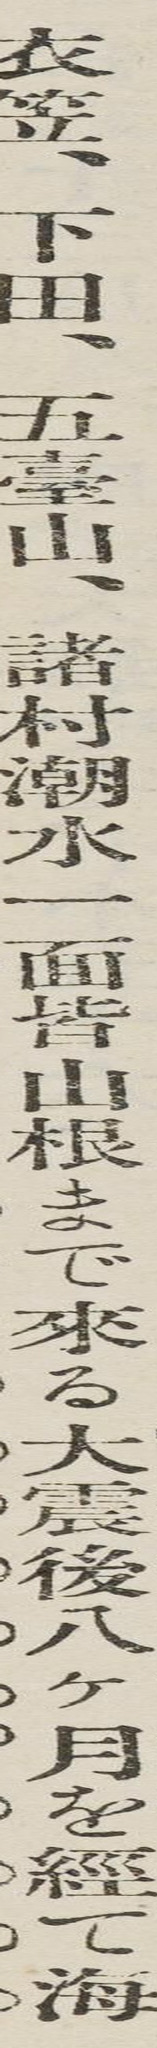衣笠、下田、五台山、諸村潮水一面皆山根まで来る大震後八ヶ月を経て海
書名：土佐古今ノ地震
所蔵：東京大学地震研究所図書室 Earthquake Research Institute Library, The University of Tokyo, JAPAN
